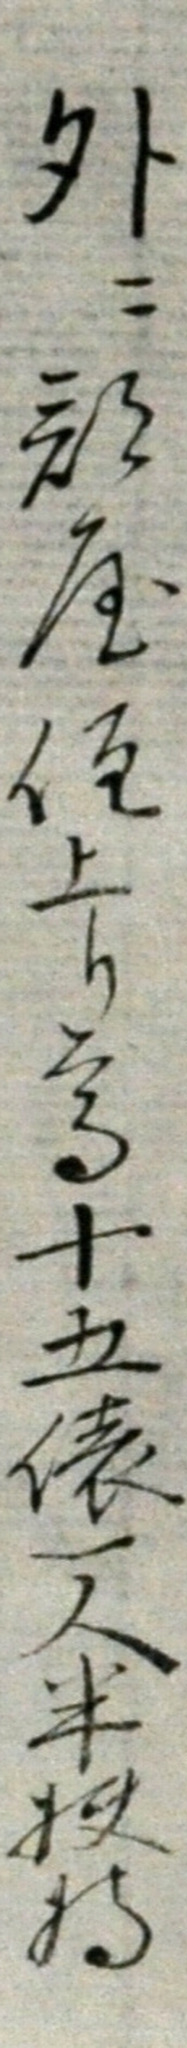外ニ部屋住上リ高十五俵一人半扶持
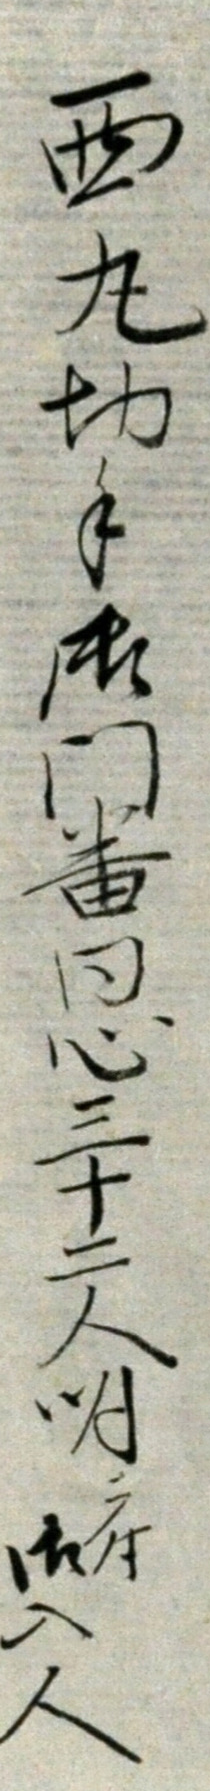西丸切手御門番同心三十二人明ニ付御入人
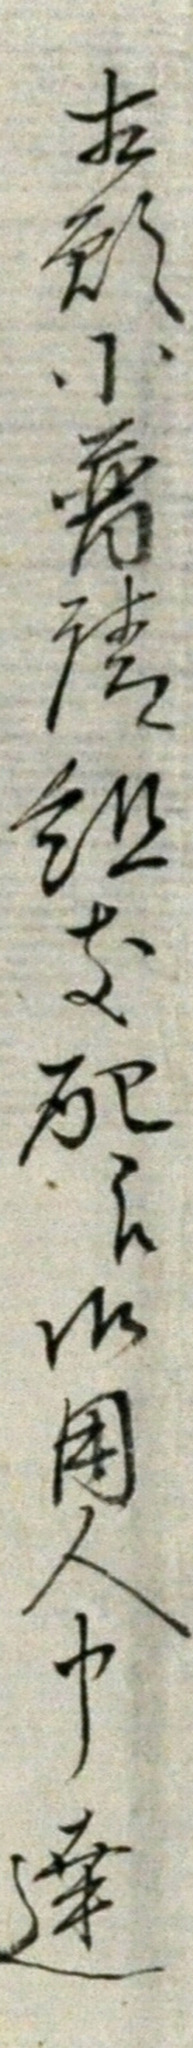相頼小普請組支配江御用人申達
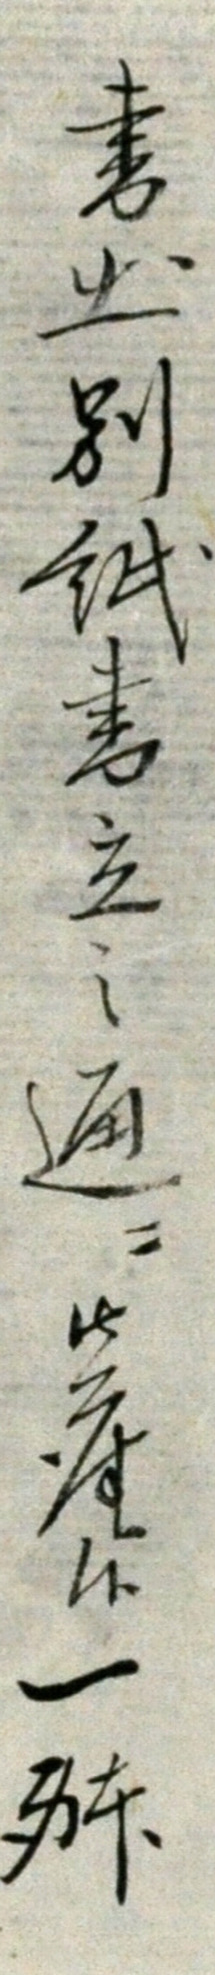書上別紙書立之通ニ御座候一躰
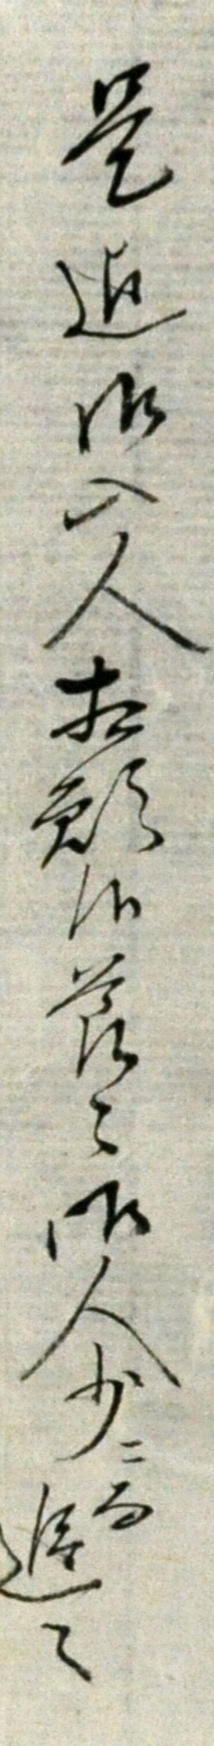是迄御入人相頼候節ニ御人少ニ而追
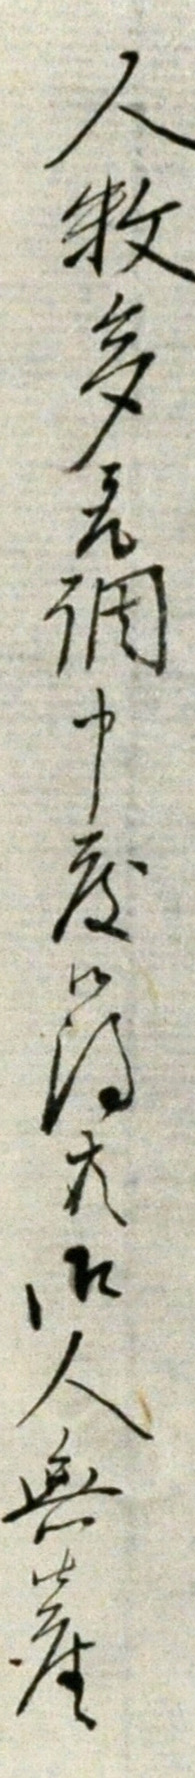人数多ニ取調申度候得共御人無御座
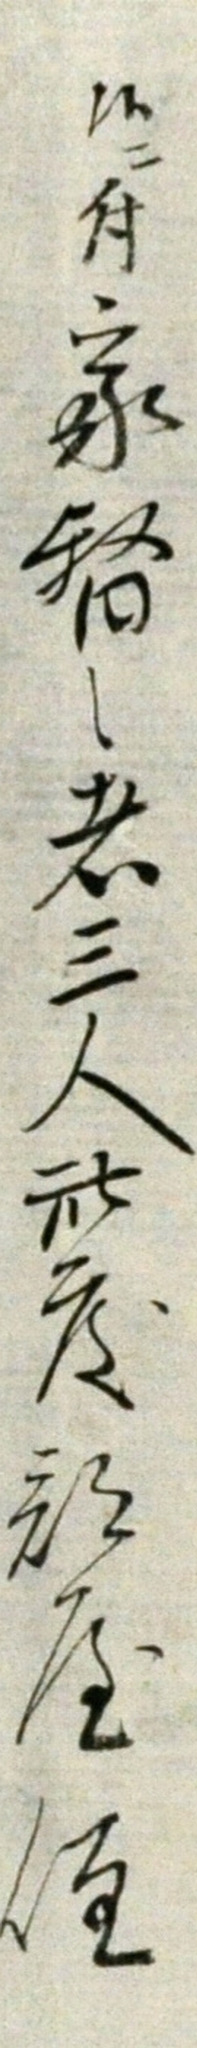候ニ付家督之者三人此度部屋住
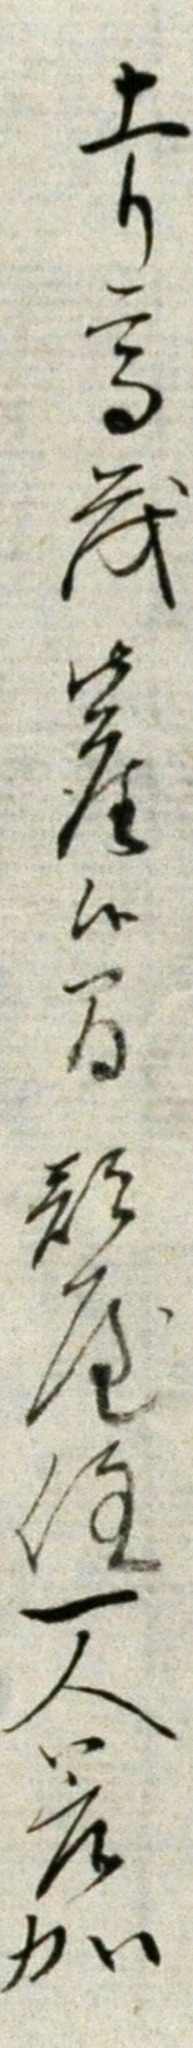上り高茂御座候間部屋住一人差加
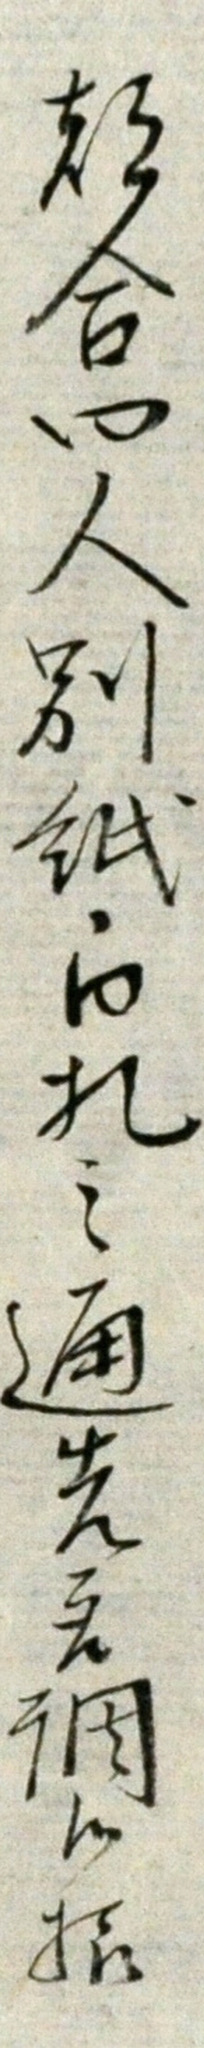都合四人別紙白札之通先取調候様
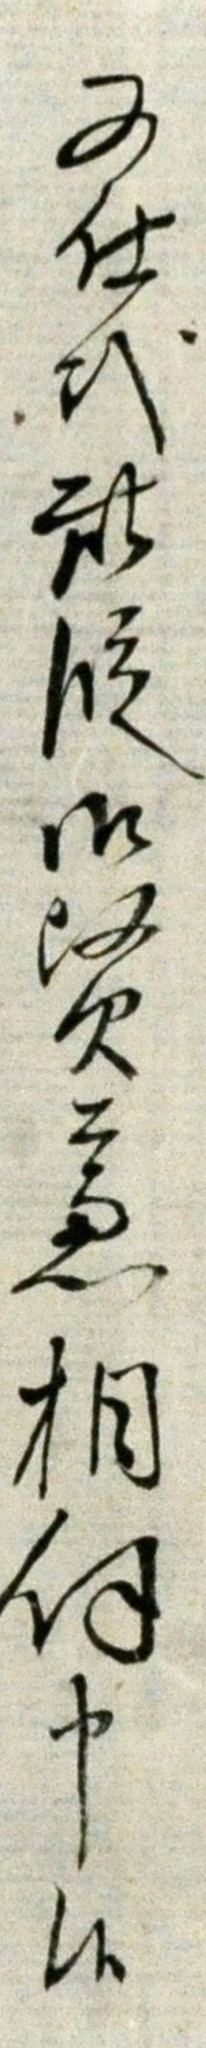可仕哉此段御賢慮相伺申候
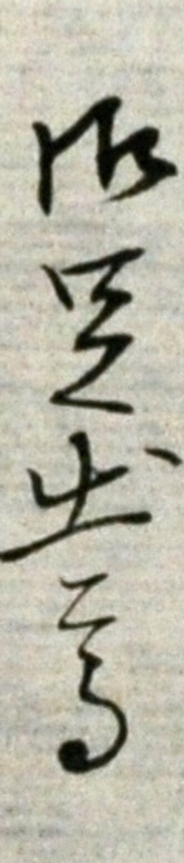御足出高
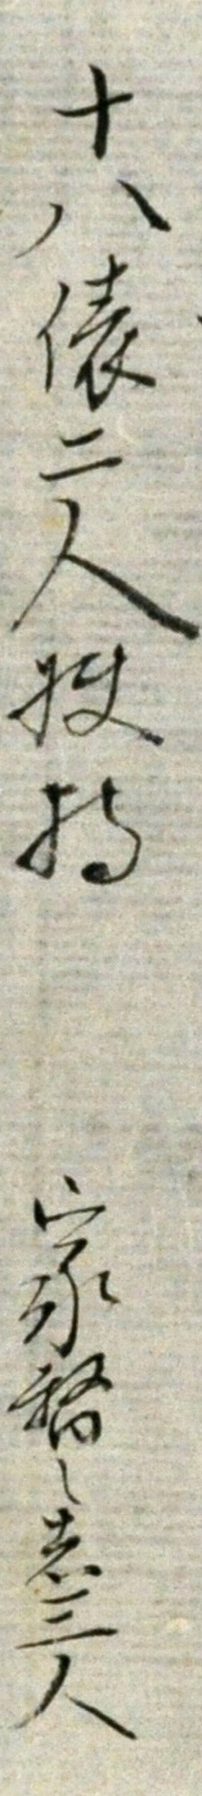十八俵二人扶持家督之者三人
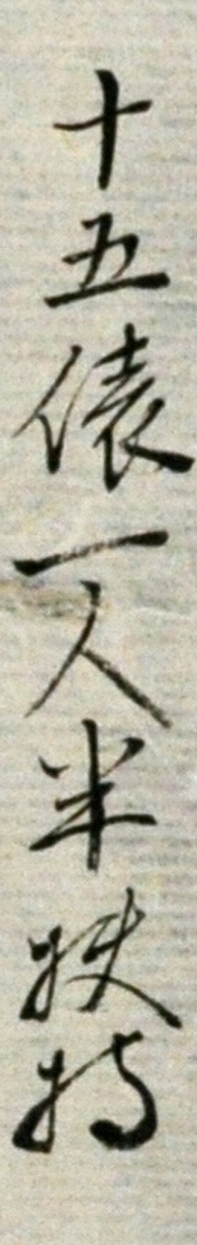八俵一人半扶持
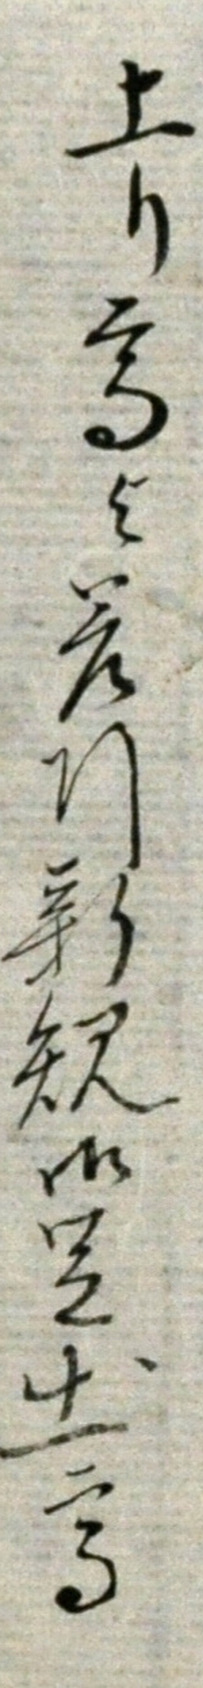上り高与差引新規御足出高
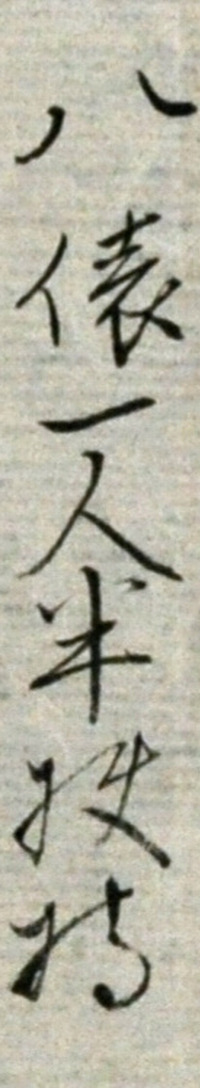八俵一人半扶持

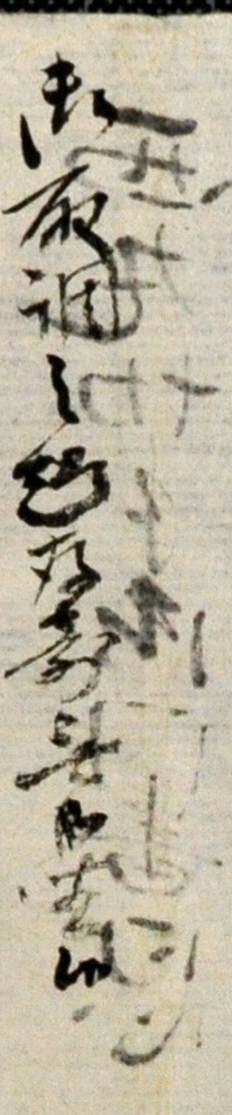御取紙之趣存寄無御座候
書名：若年寄御役中御調書付
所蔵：伊那市立高遠町図書館・合同会社AMANE
